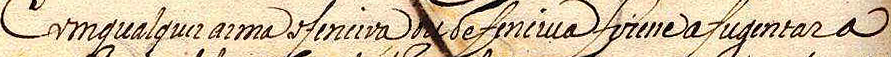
Com qualquer arma ofenciva, ou defenciua fizesse afugentar a
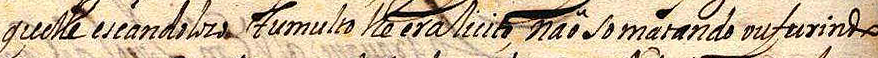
quelle escandalozo tumulto lhe era licito, naõ so matando ou ferindo
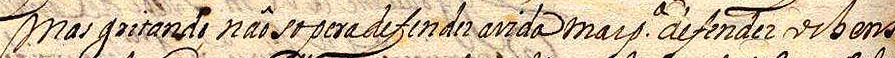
mas gritando naõ so pera defender a vida mas p.a defender os bens
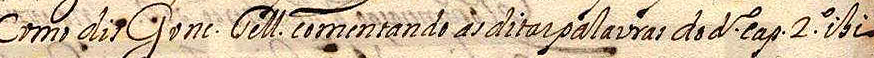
Como dis Gonc. Tell. comentando as ditas palavras do d.o cap. 2.o ibi
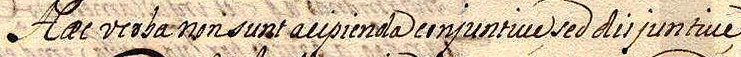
Hæc verba non sunt acipienda conjuntiue, sed disjuntiue,
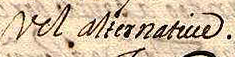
vel alternatiue.
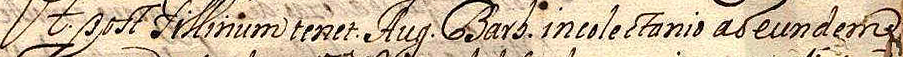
Vt. post Fillinum tenet. Aug. Barb. in colectanio ad eundem
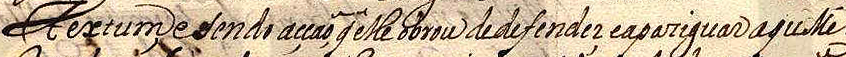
textum, e sendo acçaõ q̄ elle obrou de defender, e apaziguar aquelle
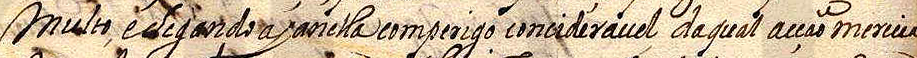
multo, e chegando a janella com perigo, conciderauel, da qual acçaõ merecia
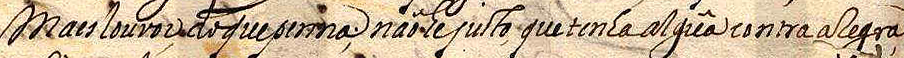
maes louvor, do que penna; naõ he justo, que tenha alguā contra a Regra,
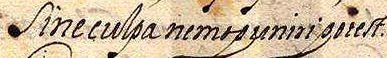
sine culpa nemo puniri potest.
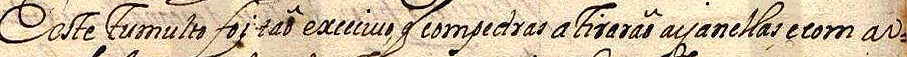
E este tumulto foi taõ exceciuo, q̄ com pedras atiraraõ as janellas, e com ar
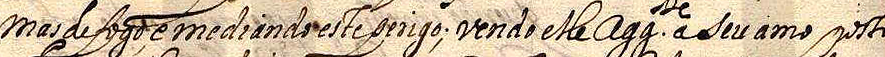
mas de fogo, e mediando este perigo; vendo elle agg.te a seu amo posto
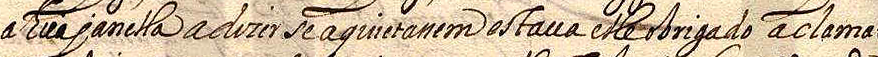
e hua janella a dizer se aquietassem estaua elle obrigado a clamar
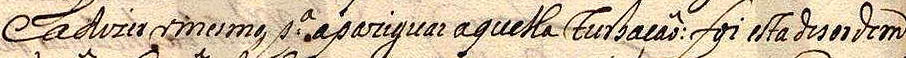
e a dizer o mesmo, p.a apaziguar aquella turbaçaõ: foi esta desordem
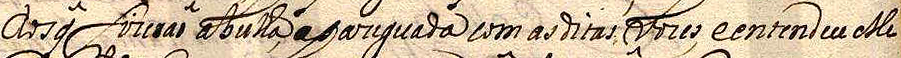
aos q̄ fizeraõ a bulla, apaziguada com as ditas vozes, e entendeu elle
